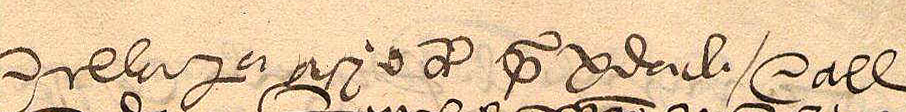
e ella ta asy o tē p̄o ꝟdade / e all
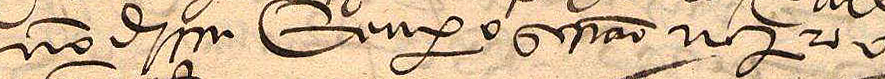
nō djsse E eu ꝑo serrão notro o
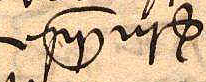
esp̄uj
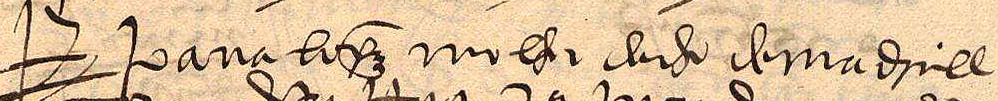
item Joana lop̄z molher de do de madrill
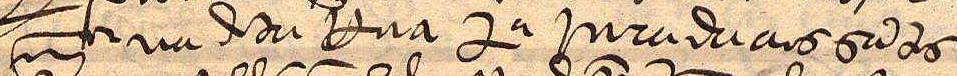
mor na dita Rua ta Jurada aos sātos
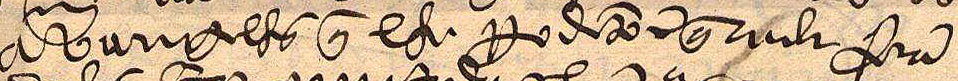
avangelhos q̄ lhe ꝑ o dito ēq̄redor forā
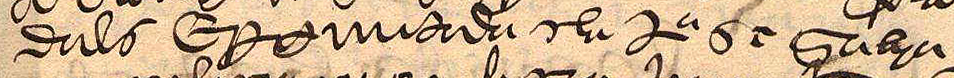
dados E ꝑguntada ela ta se sabya
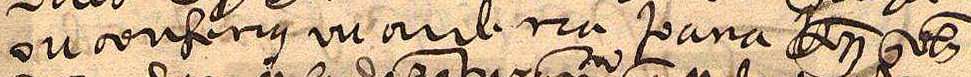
ou conhecia ou onde era Joana Rōiz sobr̄
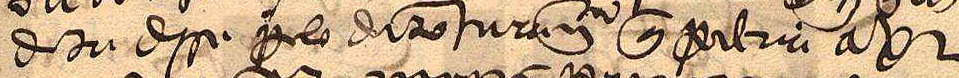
dita djse pelo dito Juramto q̄ poderia aꝟr
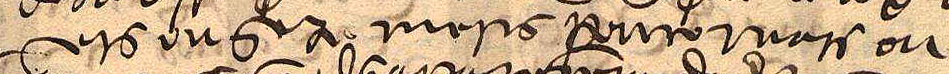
sejs ou sete meses pouco majs ou
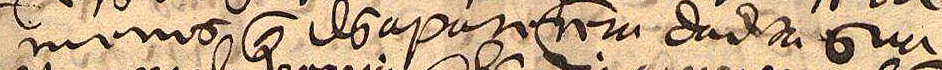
menos q̄ desaparecera da dita sua
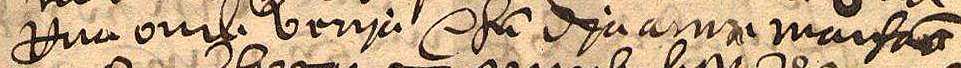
Rua onde veuja e hū dja amte manhaā
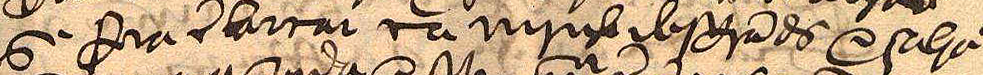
se fora ēbarcar camjnho de frādes e sabja
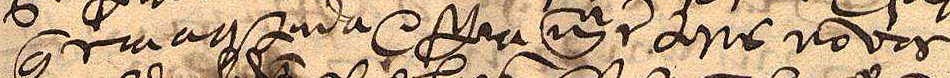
q̄ era a ꝯteuda e fora mor ē tores novas
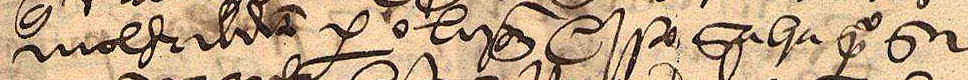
molher do dito ꝑo lopz̄ e Jsto sabja p̄o ser
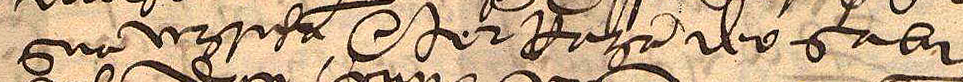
sua vezjnha e ter Razā de o saber
